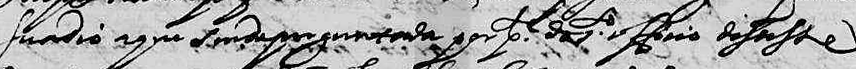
suadio a que sendo perguntada por p.te do st.o officio dissesse
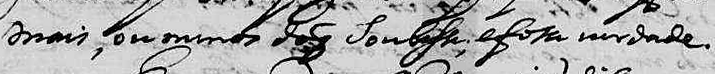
mais, ou menos do q̄ soubesse, e fosse uerdade.
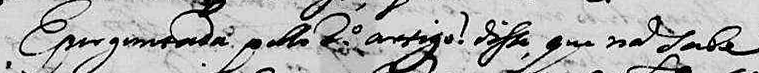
E perguntada pello 2.o artigo? disse, que naõ sabe
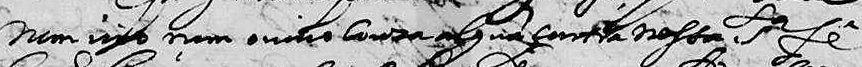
nem ujo nem ouuio couza alguā contra nossa Sta fê
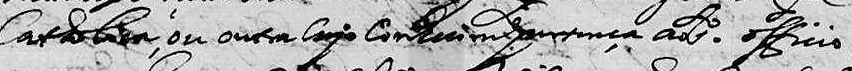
Catholica, ou outra cujo conhecimto pertença ao s.to officio.
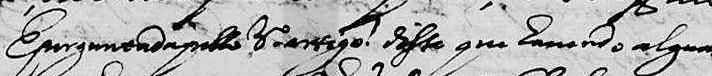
E perguntada pello 3.o artigo? disse que hauendo alguās
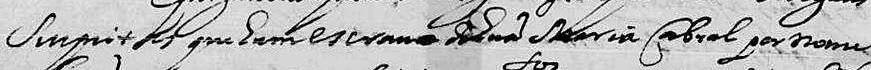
Suspeitas que hum escrauo de huā Maria Cabral por nome
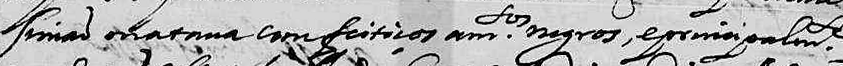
Simaõ mataua com feitiços a mto.s negros, e principalmt.e
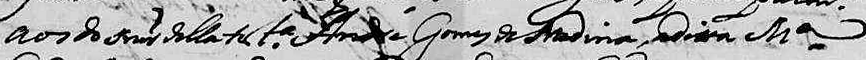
aos do snor̄ della test.a Andre Gomes de Medina, a ditta M.a
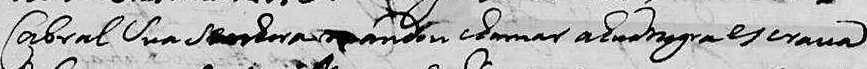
Cabral Sua senhora mandou chamar a huā negra escraua
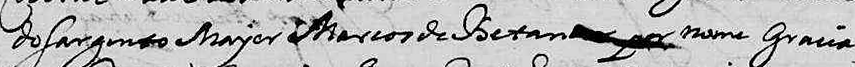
do Sargento Mayor Marcos de Betancor por nome Gracia
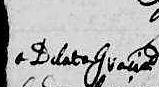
a Delata Gracia
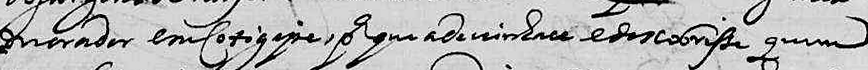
morador em Cotigipe, pa que adeuinhace e descobrisse quem
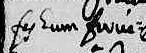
fes hum ferue
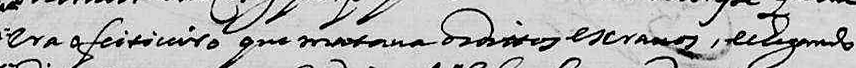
era o feiticeiro que mataua os dittos escrauos, e chegando
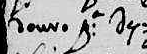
douro p:a des
